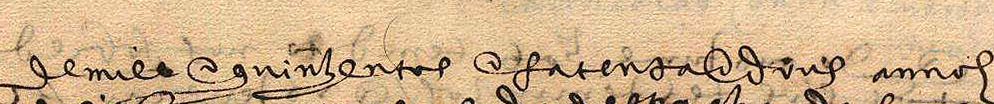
de mill e quinhentos e satenta e dous annos
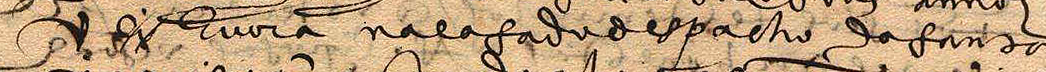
ē lis Euora na casa do despacho da santa
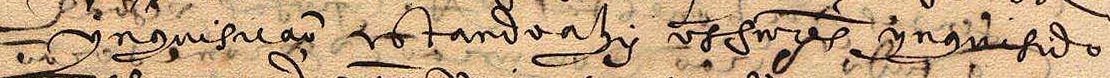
ynquisiçaõ estando ahy os sn̄res ynquisido
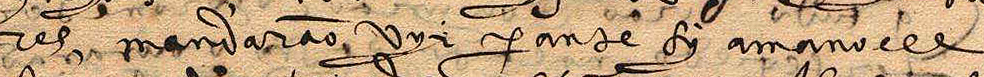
res mandarão vyr ꝑante sy a manoell
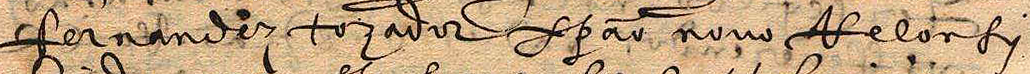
fernandez tozador xpão nouo Reconsy
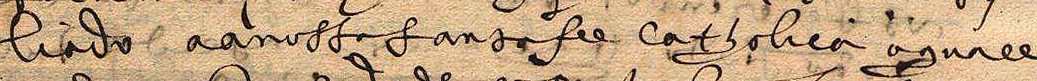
liado aa nossa santa fee catholica o quall
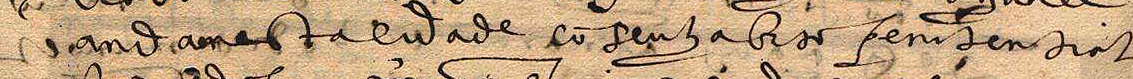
anda nesta çidade cō seu habito penitentiaL
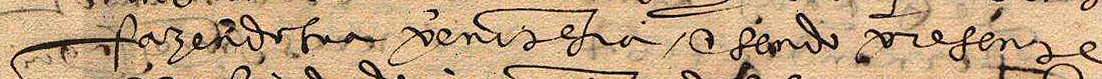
fazendo sua penitēsia / e sendo presente
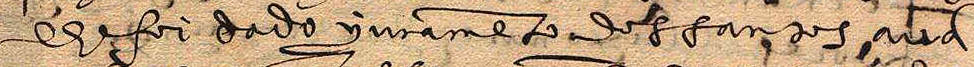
lhe foi dado yuramēto dos santos auā
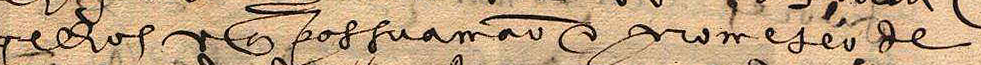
gelhos e q̄ pos sua mão e prometeo de
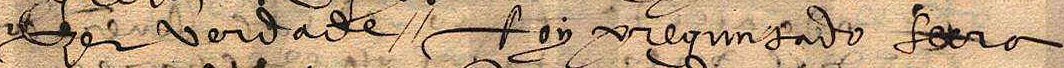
zer verdade // foy preguntado se era
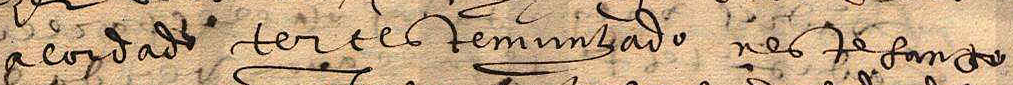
acordado ter testemunhado neste santo
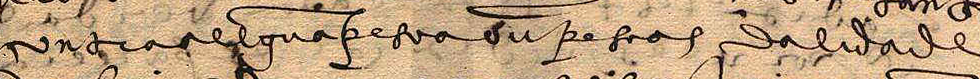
contra allgūa pesoa ou pesoas da cidade
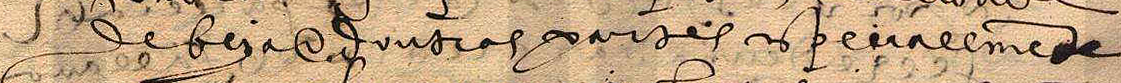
de beya e doutras partes especiallmēte
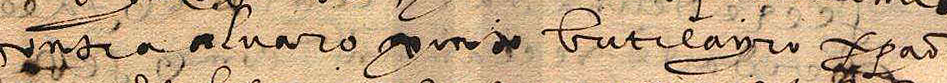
contra aluaro pinto buticayro Xpaõ
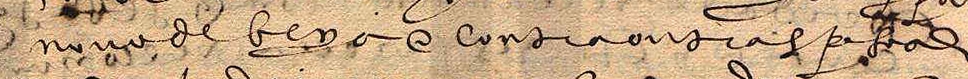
nouo de beya e contra outras pesoas
